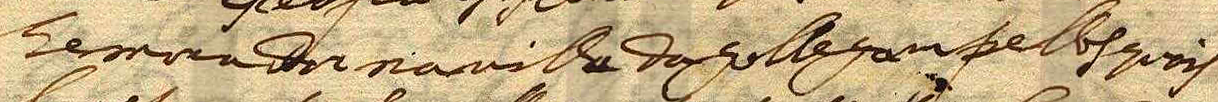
he morador na villa da gollegam pellos quais
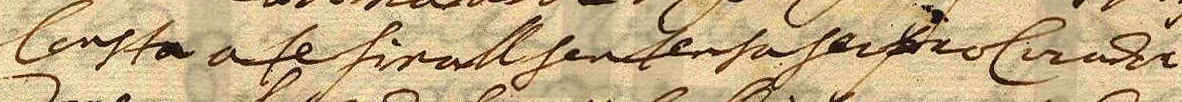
Consta ate finall sentensa ser proCurador
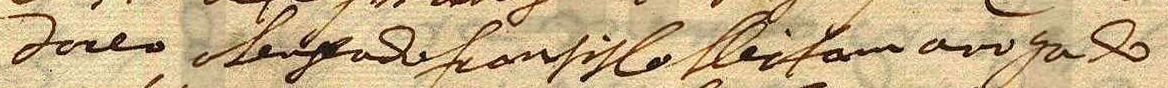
do reo o lenseado fransisCo lleitam avogado
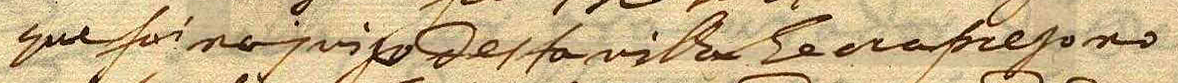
que foi no juizo desta villa he ora prezo no
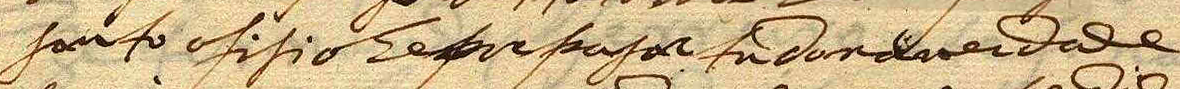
santo ofisio he por pasar tudo na verdade
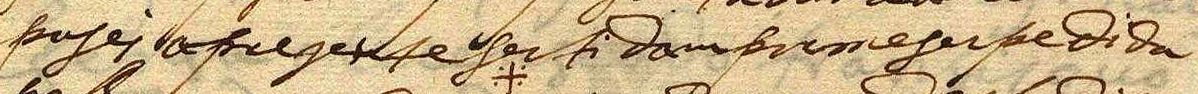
pasei a prezente sertidam por me ser pedida
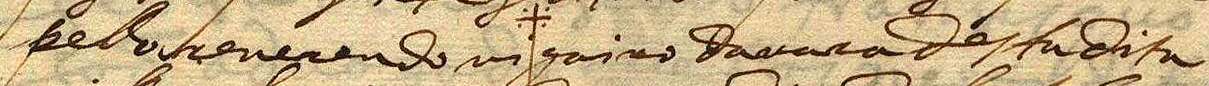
pello reuerendo vigairo da vara desta dita
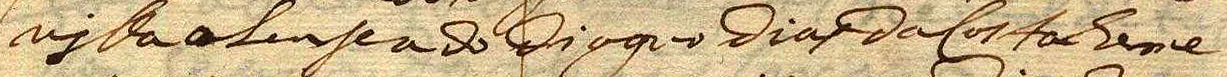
vjlla o lenseado dioguo dias da Costa he me
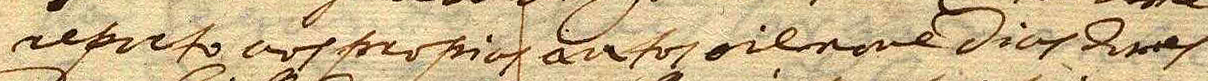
reporto aos propios autos oie noue dias do mes
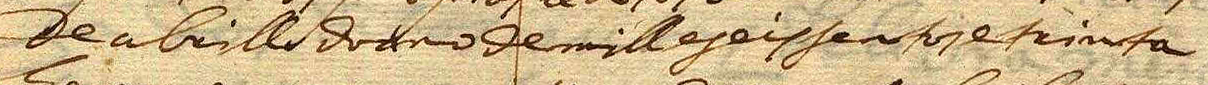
de abrill do ano de mill e seissentos e trimta
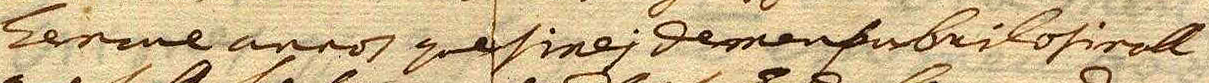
he noue annos que sinej de meu pubrico sinall
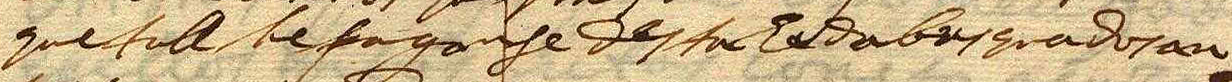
que tall he pagouse desta he da busqua dos au
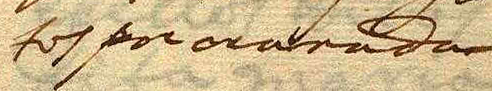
tos por ora nada
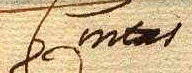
Contas
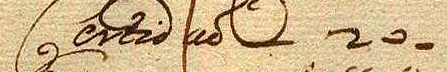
Certidaõ - 20-
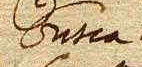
busca
